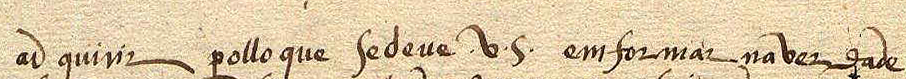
adquirir pollo que se deue V. s. emformar na verdade
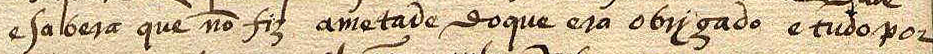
e sabera que n̄o fiz a metade do que era obrigado e tudo por
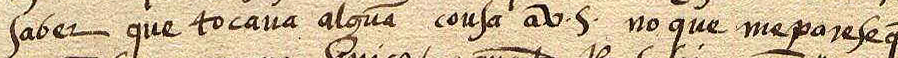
saber que tocaua algūa cousa a V. s. no que me parese q̄
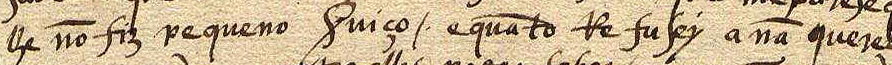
lhe nō fiz pequeno ꞩuiço /. e qūato Refusey a nā querer
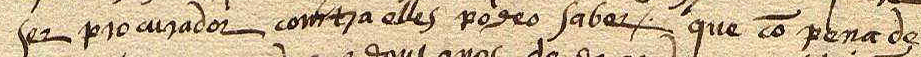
ser procurador comtra elles podeo saber /. que c̄o pena de
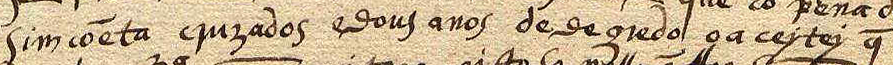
simcoēta cruzados e dous anos de degredo o aceytey q̄
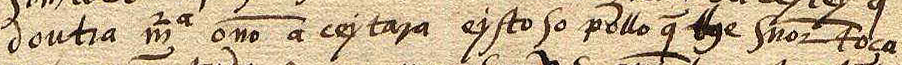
doutra mra o n̄o aceytara e ysto so pollo q̄ lhe snōr toca
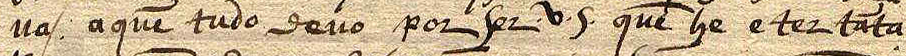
ua /. a quē tudo deuo por ser V. s. quē he e ter tāta
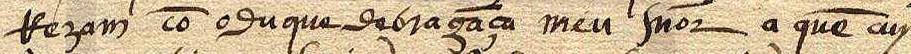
Rezam c̄o o duque de bragāça meu snōr a qūe cuy
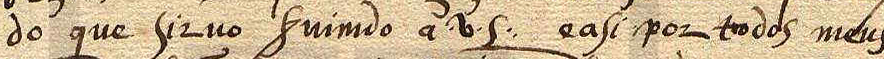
do que siruo ꞩuindo a V. s. e asi por todos meus
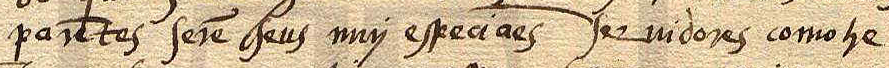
parētes serē seus muy especiaes seruidores como he
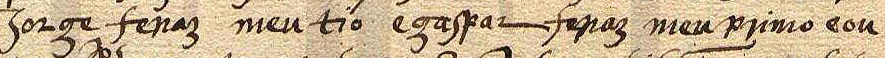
Jorge ferraz meu tio e gaspar ferraz meu primo e ou
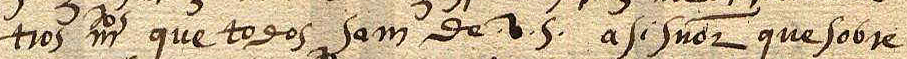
tros mtos que todos sam de .V. s. asi sn̄or que sobre
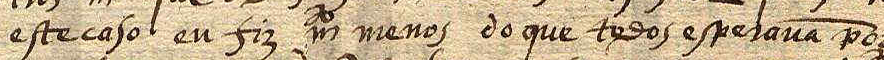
este caso eu fiz mto menos do que todos esperauā por
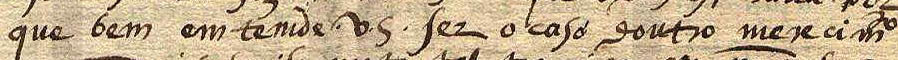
que bem emtemde V. s. ser o caso doutro merecimto
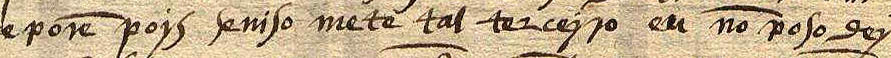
e porē poys se niso mete tal terceyro eu nō poso dey
